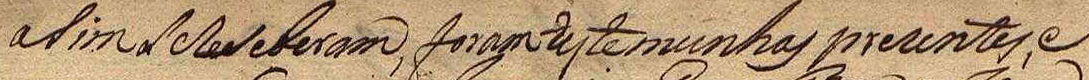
asim o Reseberam, foram testemunhas prezentes, e
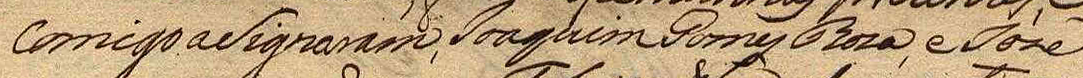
comigo asignaram, Ioaquim Gomes Roza, e Ioze
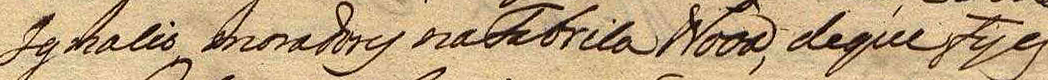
Ignacio moradores na Fabrica Nova, de que Fis es
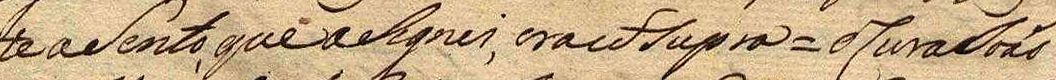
te asento, que asignei, era ut supra = o Cura Ioão
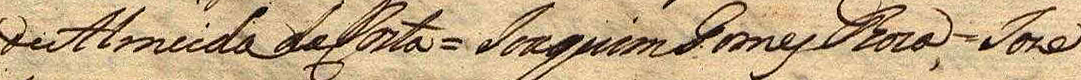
de Almeida da Costa= Ioaquim Gomes Roza,= Ioze
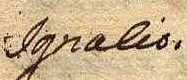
IgnaCio.
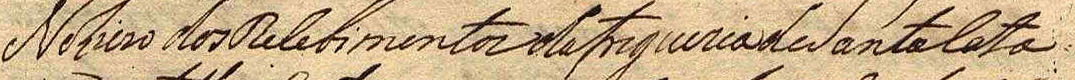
No Livro dos ReCebimentos da freguezia de Santa Cata
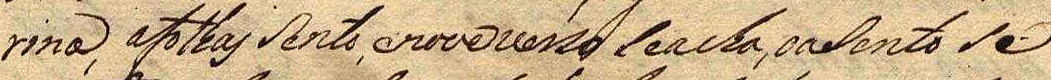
rina, a folhas sento, e nove verso se acha, o asento se
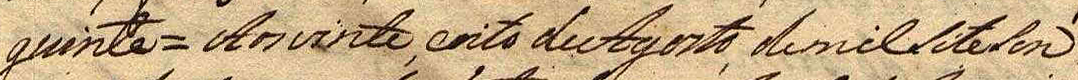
guinte= Aos vinte, e oito de Agosto, de mil setesen
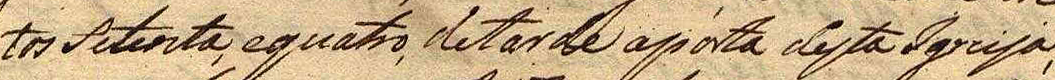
tos setenta, quatro, de tarde a porta desta Igreja,
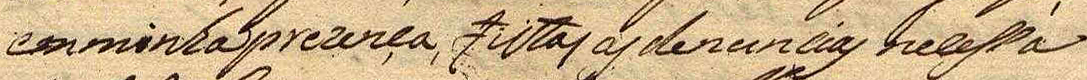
em minha prezença feitas as denuncias necessa
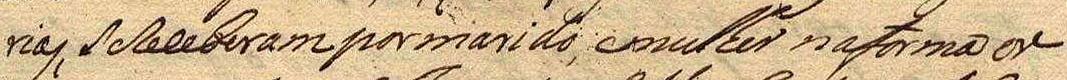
rias, se Receberam por marido, e mulher na forma or
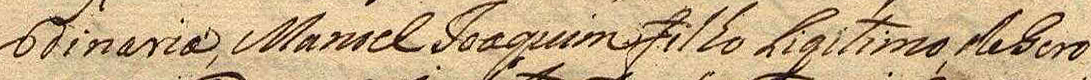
dinaria, Manoel Ioaquim filho Ligitimo, de Gero
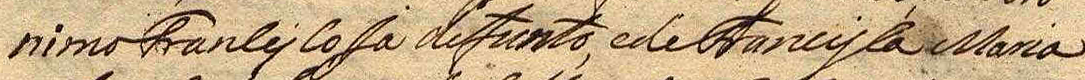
nimo Francisco Ja defunto, e de Francisca Maria
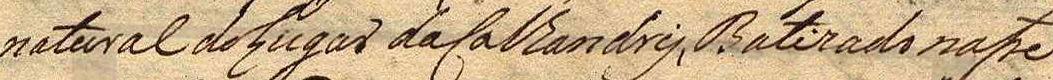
natural do Lugar da Calhandris, Batizado na fre
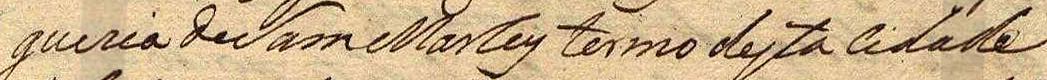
guezia de Sam MarCus termo desta cidade
